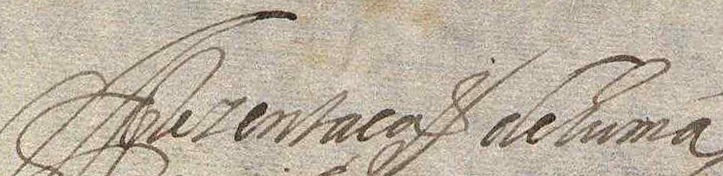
ApRezentaçaõ de huma
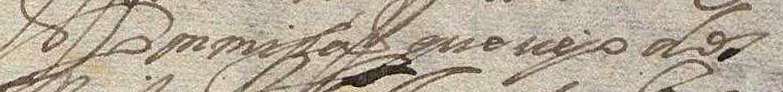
Commissaõ que uejo dos
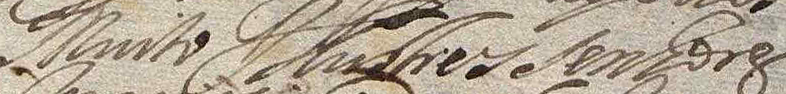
Muito llustres senhores
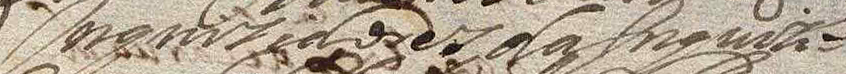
Jnquizidores da Jnquizi
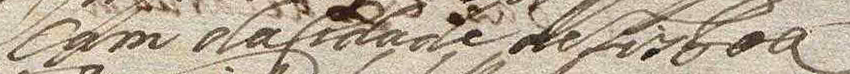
çam da Cidade de Lisboa
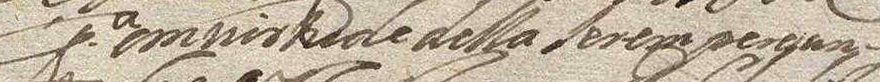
p.a em virtude della serem pergun
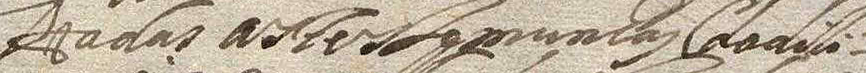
tadas as testemunhas da dili
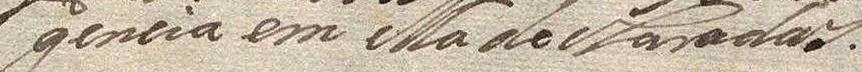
gencia em ella declaradas.
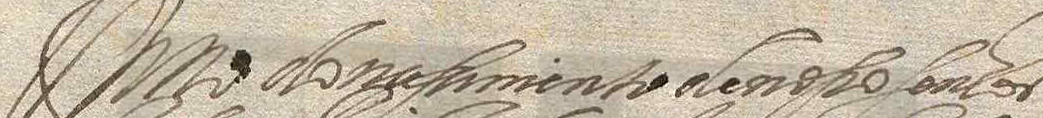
Anno do nassimento de nosso senhor
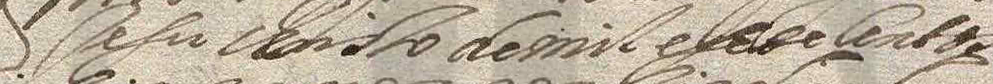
Jesu christo de mil e seteCentos
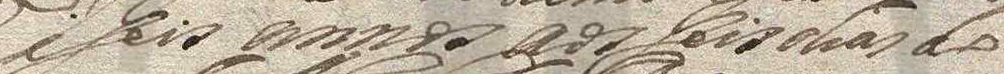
e seis annos aos seis dias do
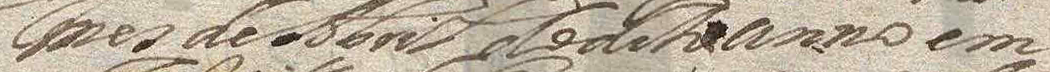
mes de Abril do dito anno em
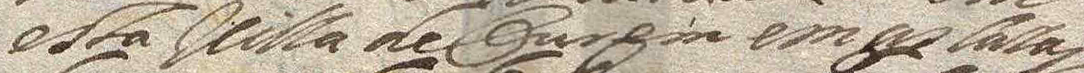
esta Villa de Ourem em as cazas
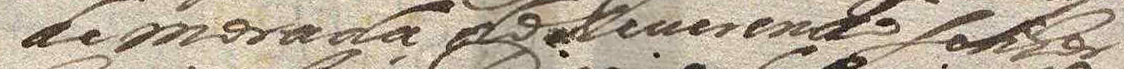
de morada do Reuerendo senhor
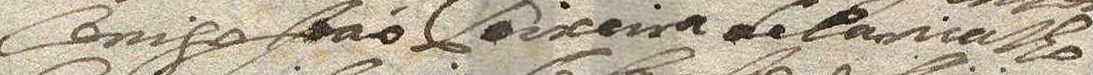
Conigo Joaõ Teixeira de Carvalho
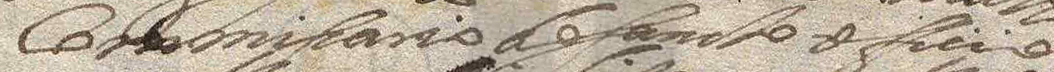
Commissario do santo oficio
